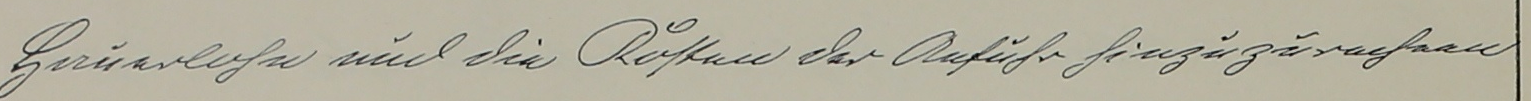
Hauerlohn und die Kosten der Anfuhr hinzuzurechnen
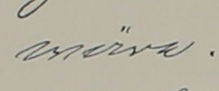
wäre.
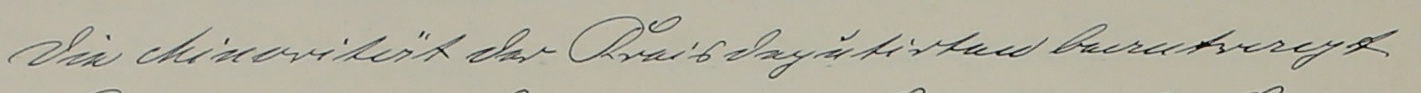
Die Minorität der Kreisdeputirten beantragt
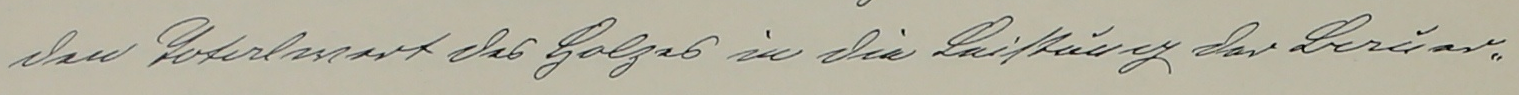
den Totalwert des Holzes in die Leistung der Bauer-
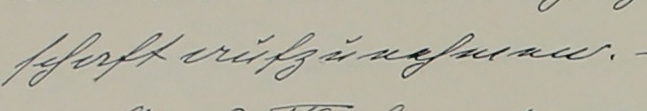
schaft aufzunehmen.
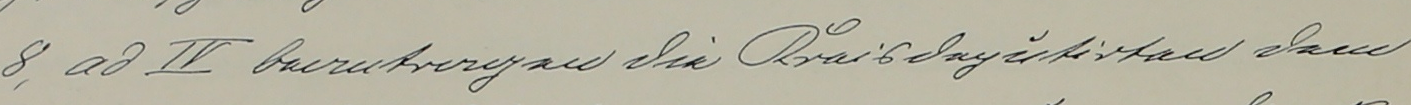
8. ad IV beantragen die Kreisdeputirten dem
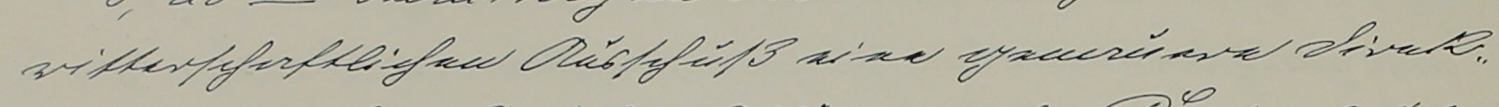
ritterschaftlichen Ausschuß eine genauere Direk-
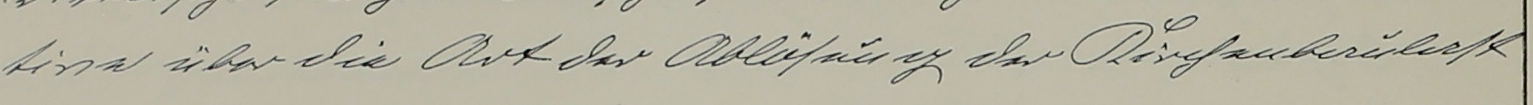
tive über die Art der Ablösung der Kirchenbaulast
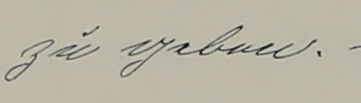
zu geben.
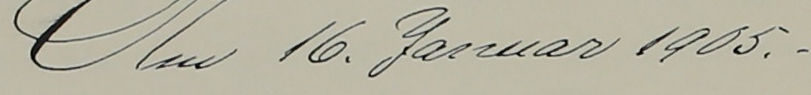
Am 16. Januar 1905.
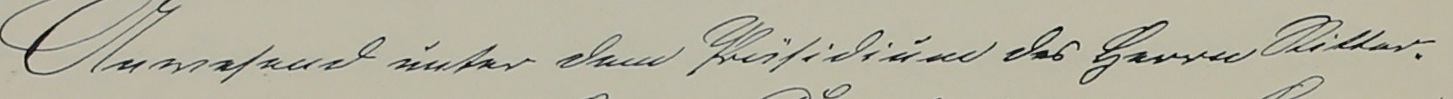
Anwesend unter dem Präsidium des Herrn Ritter-
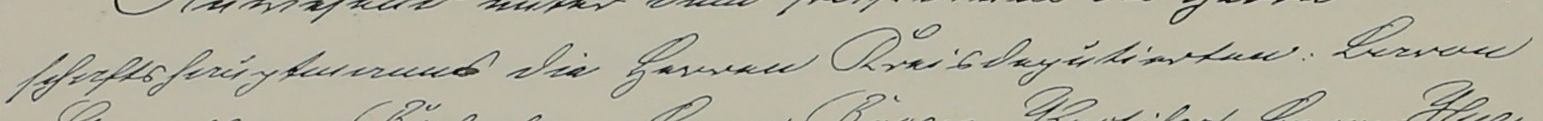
schaftshauptmanns die Herren Kreisdeputierten: Baron
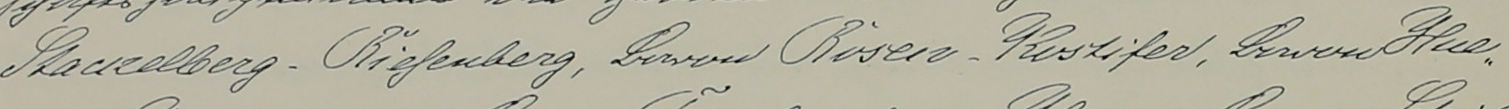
Stackelberg-Riesenberg, Baron Rosen-Kostifer, Baron Hue-
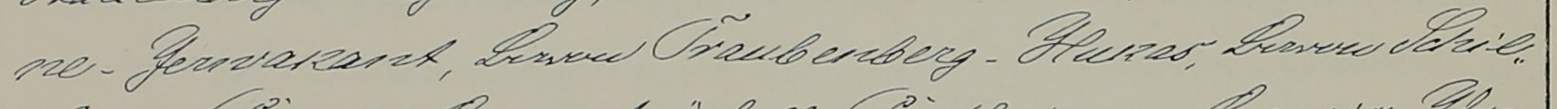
ne-Jerwakant, Baron Traubenberg-Hukas, Baron Schil-
